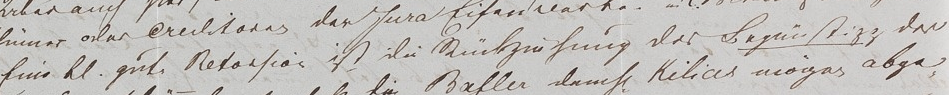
Eine kl. gute Retorsion ist die Rückziehung der Begünstigung der
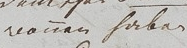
wonnen haben.
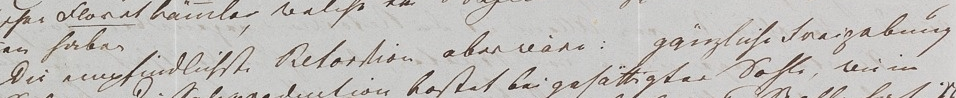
Die empfindlichste Retorsion aber wäre: gänzliche Freigabung
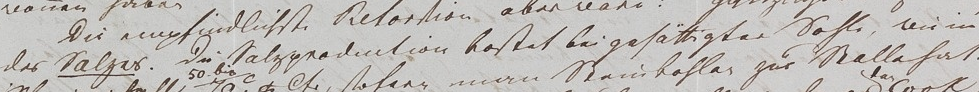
des Salzes. Die Salzproduction kostet bei gesättigter Sohle, wie in
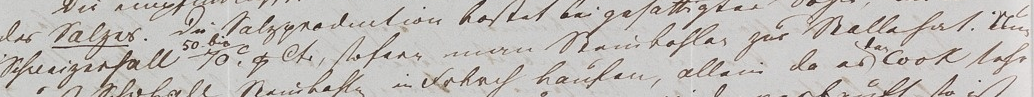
Schweizerhall 50 bis 70 c. p Ct., sofern man Steinkohle zur Stelle hat. Nun
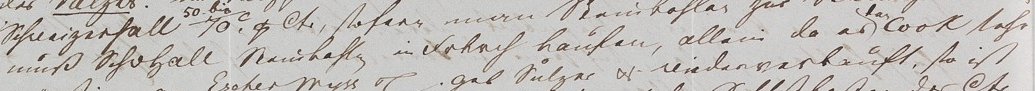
muß SchwHall Steinkohle in Frkrch kaufen, allein da es den Cook sehr
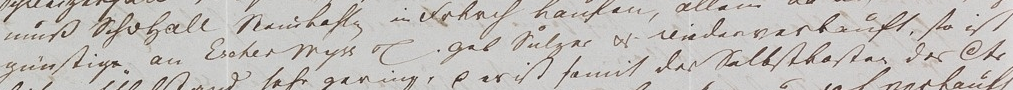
günstig an Escher Wyss & GebSulzer usw. wieder verkauft, so ist
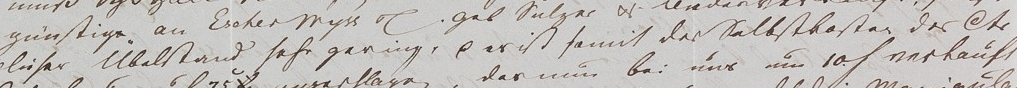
dieser Übelstand sehr gering, & es ist somit der Selbstkosten des Cts
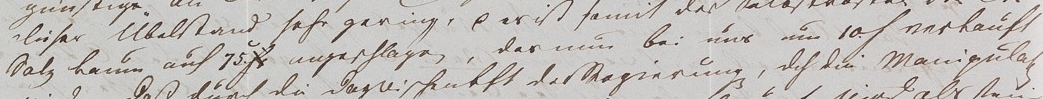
Salz kaum auf 75 frc angeschlagen, das nun bei uns um 10.f verkauft
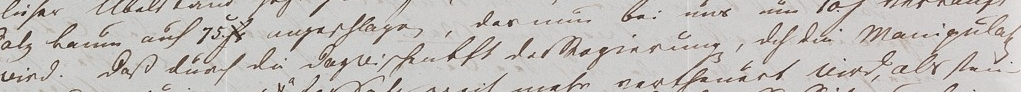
wird. Daß durch die Dazwischenkft der Regierung, dch die Manipulation
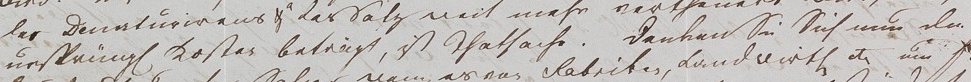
ursprünglichen Kosten beträgt, ist Thatsache. Denken Sie Sich nun die
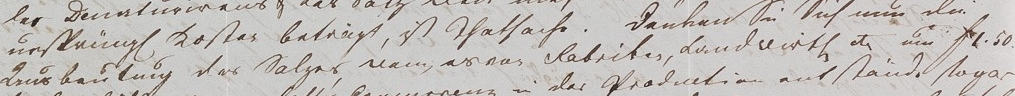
Ausbeutung des Salzes, wenn, es von Fabriken, Landwirthen etc um f 1.50.
